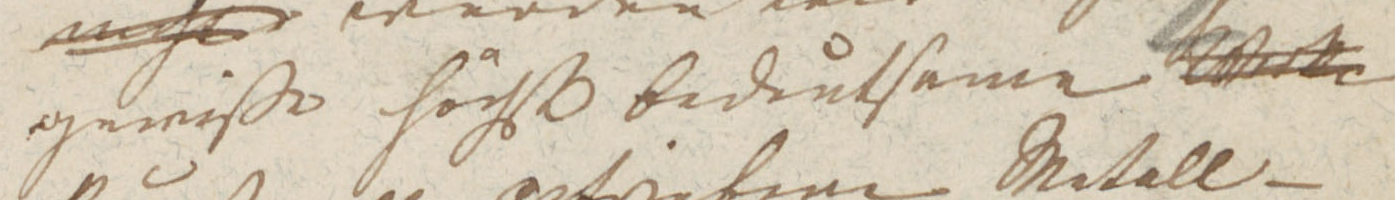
gewisse höchst bedeutsame Werke
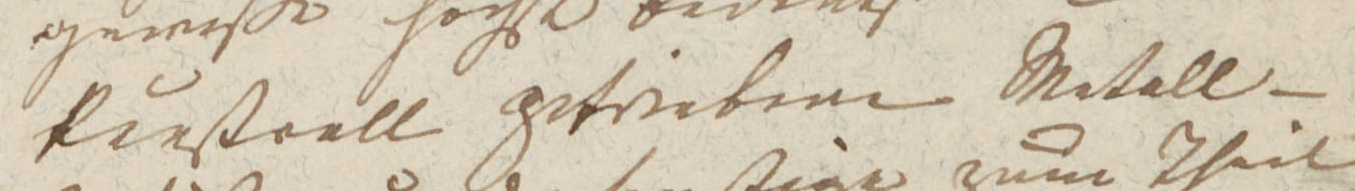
kunstvoll getriebene Metall-
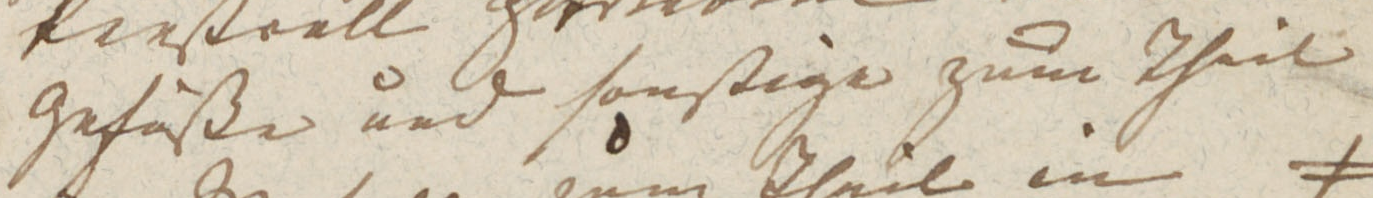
gefässe und sonstige zum Theil
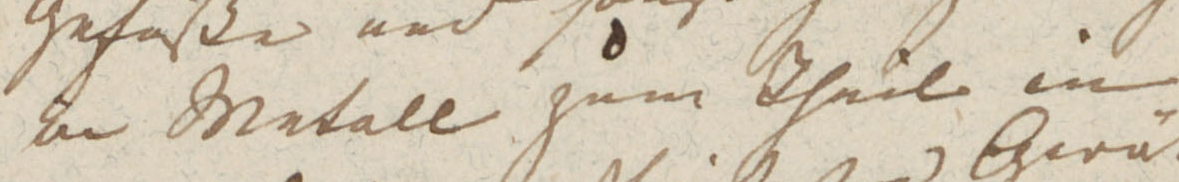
in Metall zum Theil in
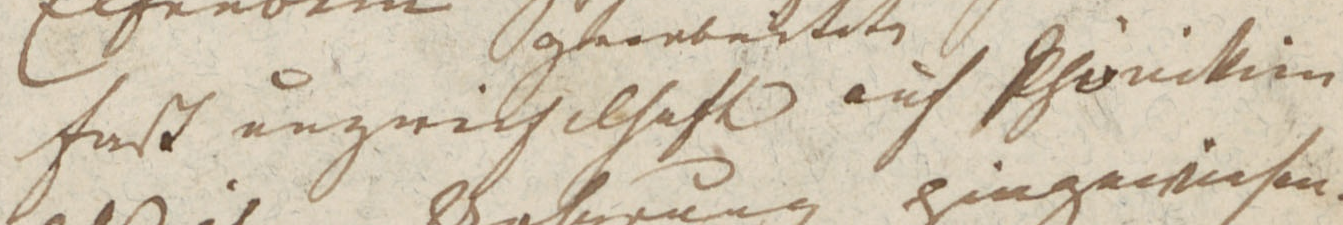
fast unzweifelhaft auf Phönikien
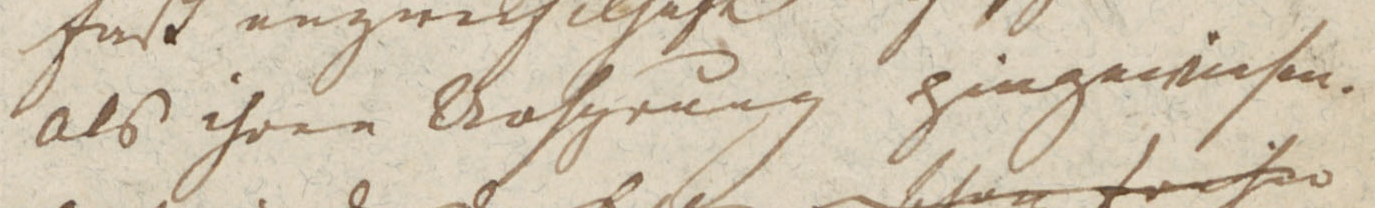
als ihren Ursprung hingewiesen.
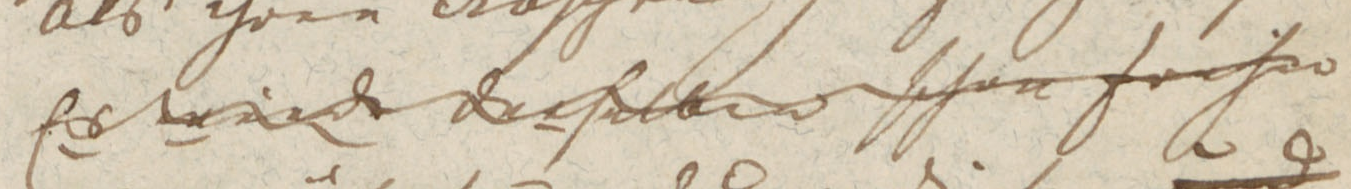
Es wurde derselben schon früher
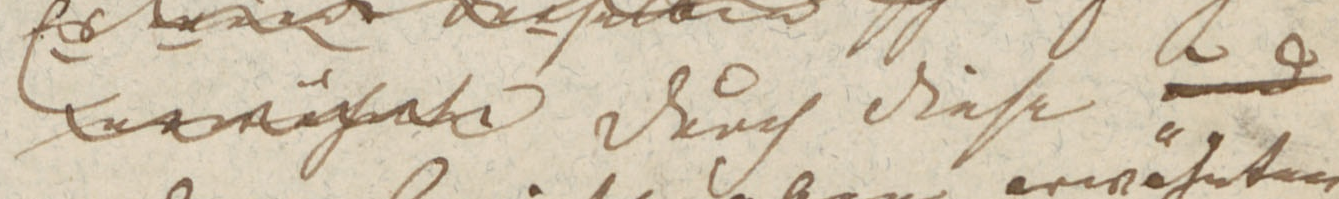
erwähnt Durch diese und
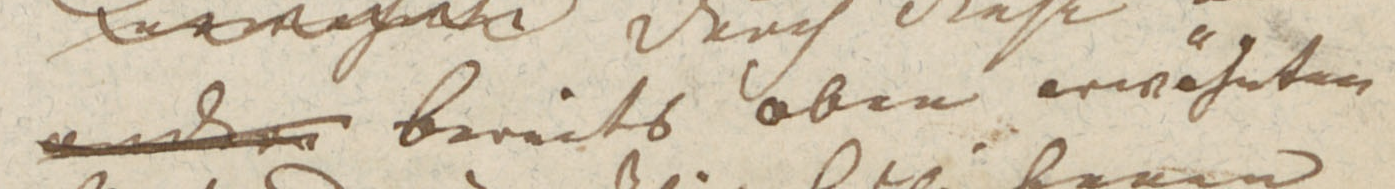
andere bereits oben erwähnten
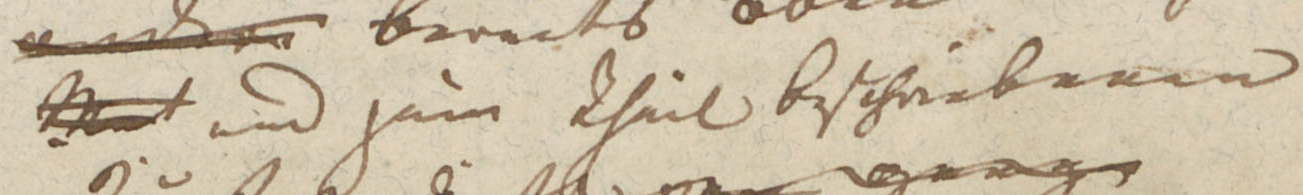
Mat und zum Theil beschriebenen
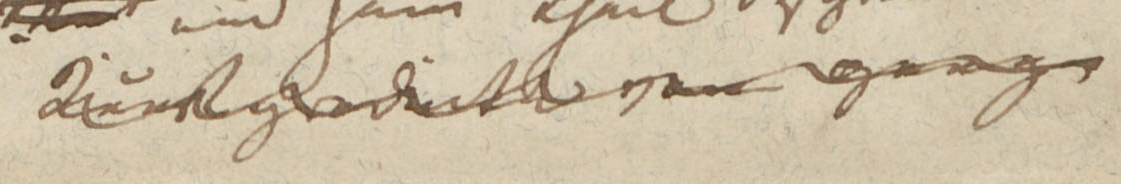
Kunstproducte von ganze
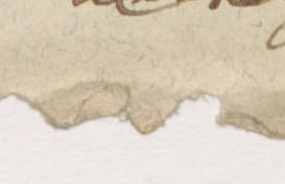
% und den
